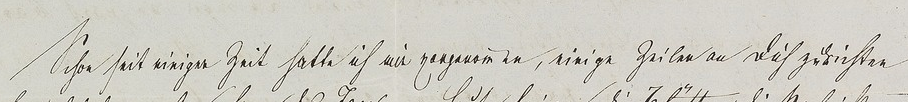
Schon seit einiger Zeit hatte ich mir vorgenommen, einige Zeilen an Dich zu richten
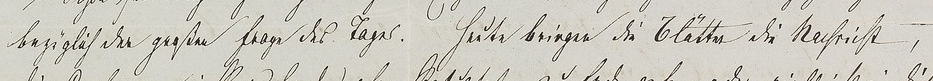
bezüglich der großen Frage des Tages. Heute bringen die Blätter die Nachricht,
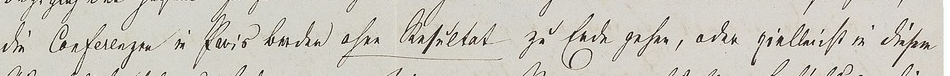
die Conferenzen in Paris werden ohne Resultat zu Ende gehen, oder vielleicht in diesem
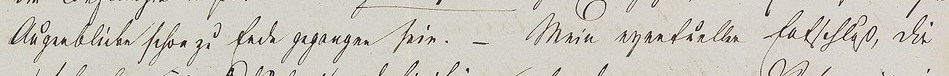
Augenblicke schon zu Ende gegangen sein. – Mein eventueller Entschluß, Dir
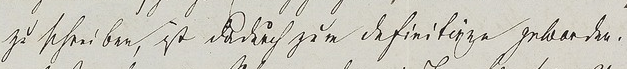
zu schreiben, ist dadurch zum definitiven geworden.
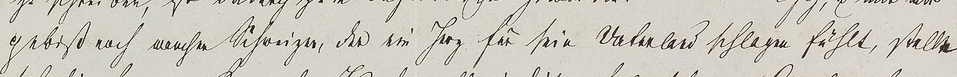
gewiß noch mancher Schweizer, der ein Herz für sein Vaterland schlagen fühlt, stellte
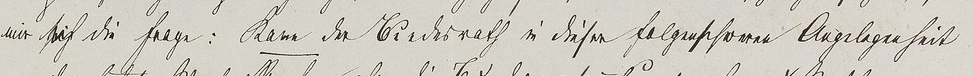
sich die Frage: Kann der Bundesrath in dieser folgenschweren Angelegenheit
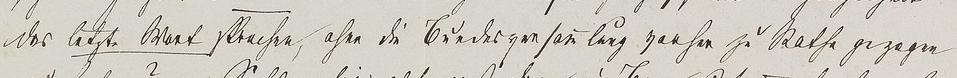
das letzte Wort sprechen, ohne die Bundesversammlung vorher zu Rathe gezogen
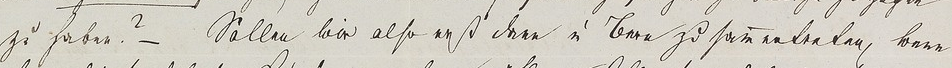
zu haben? – Sollen wir also erst dann in Bern zusammentreten, wenn
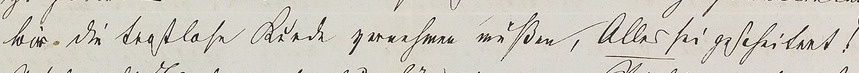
wir die trostlose Kunde vernehmen müßen, Alles sei gescheitert!
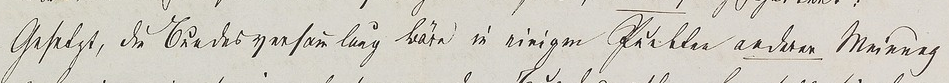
Gesetzt, die Bundesversammlung wäre in einigen Punkten andererMeinung
